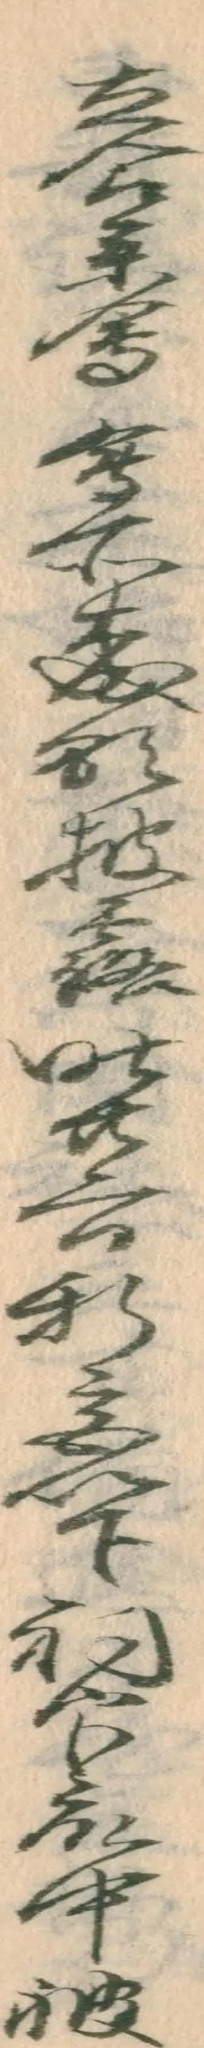一立合参会会所森雖披露昨廿二日新宮以下祠官衆中被
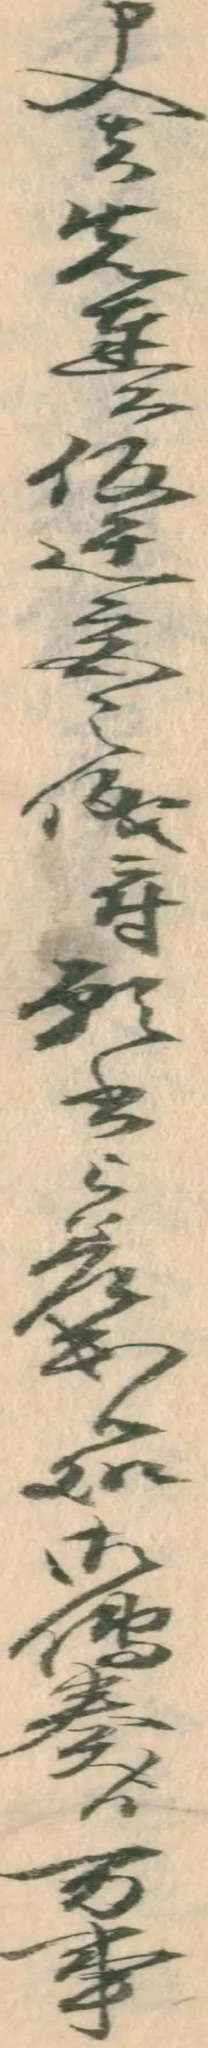申入は先達而仮迁宮之儀ニ付願書被差出候処御伝奏ゟ万事
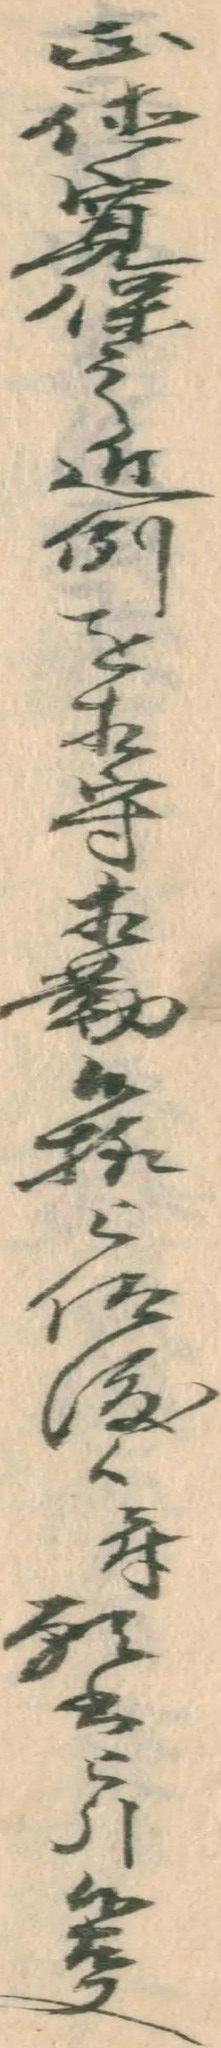正徳寛保之近例を相守相勤候様被仰渡候ニ付願書被引候事

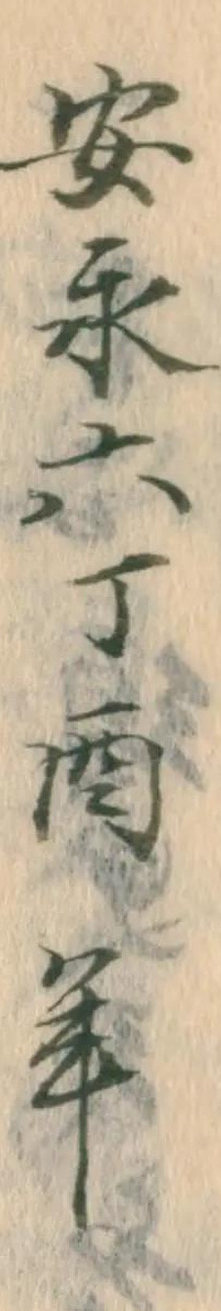安永六丁酉年
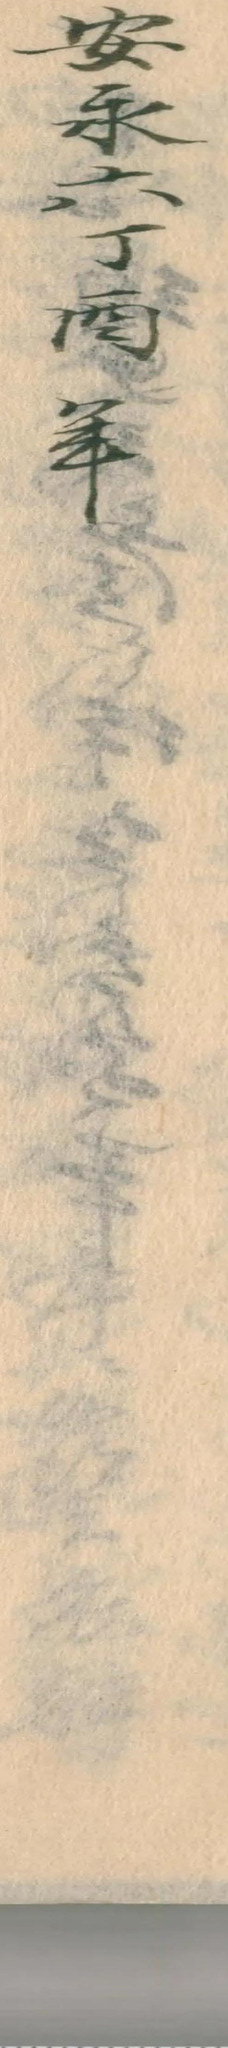安永六丁酉年
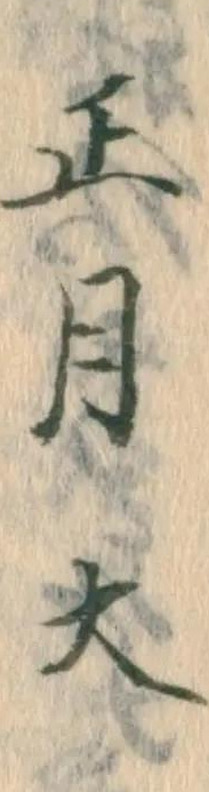正月大
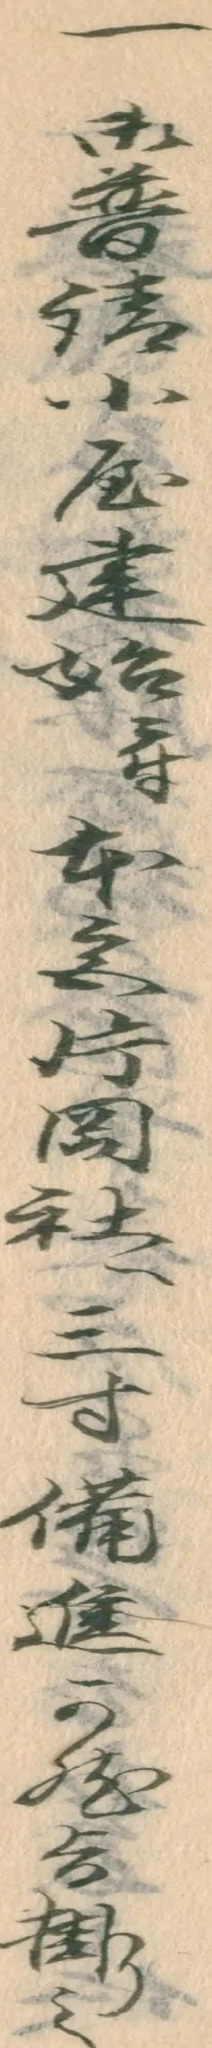一御普請小屋建始ニ付本宮片岡社ヘ三寸備進可然旨掛り之
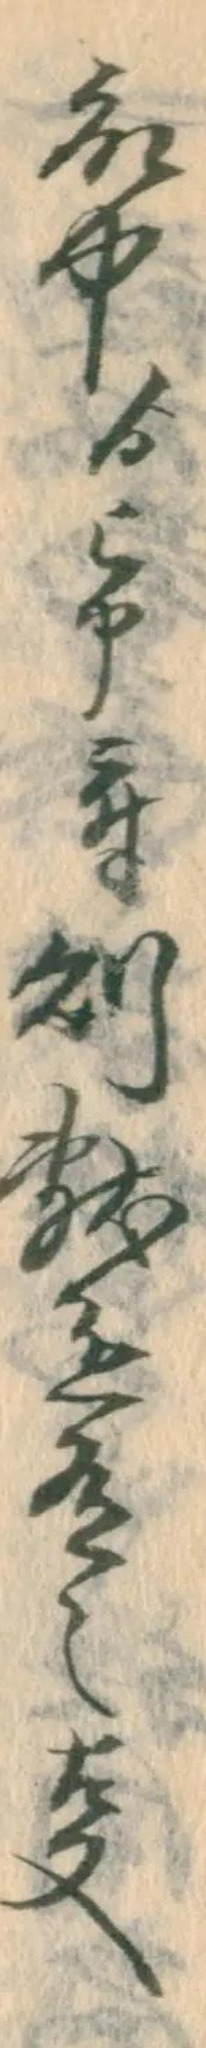衆中ゟ被申ニ付則献進有之事
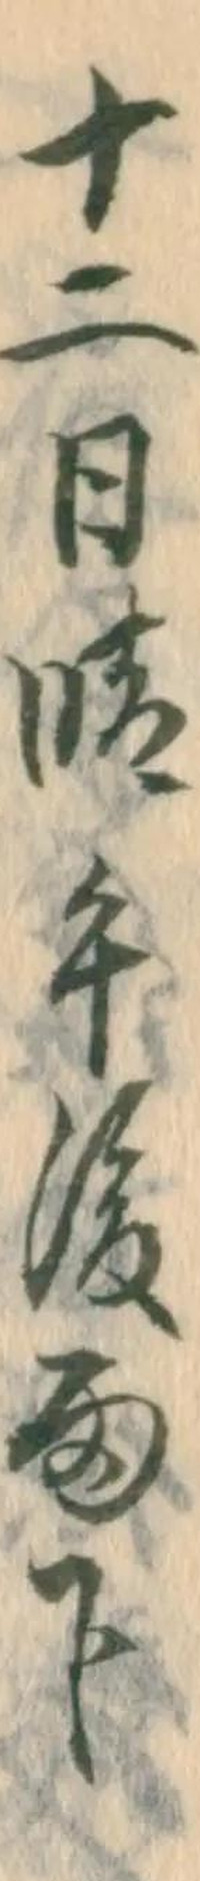十二日晴午後雨下
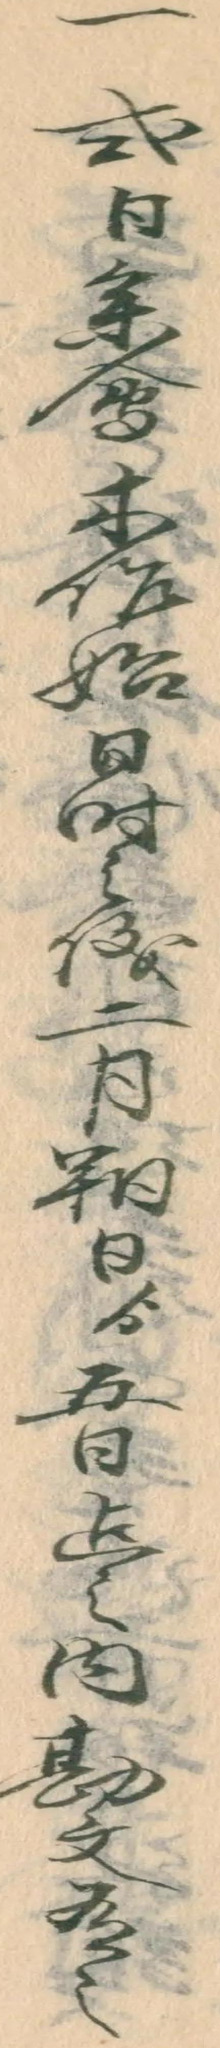一式日参会木作始日時之儀二月朔日ゟ五日迄之内勘文有之
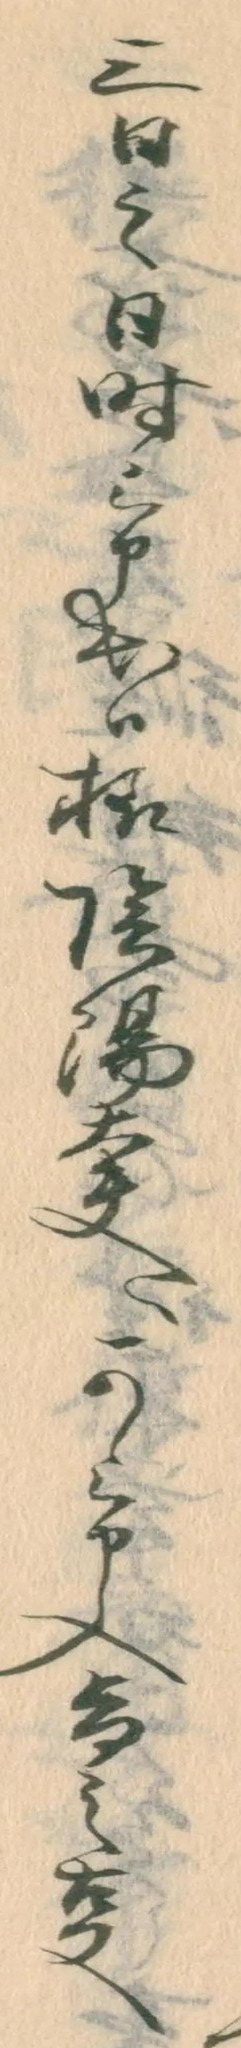三日之日時被申出候様陰陽大夫へ可被申入旨之事
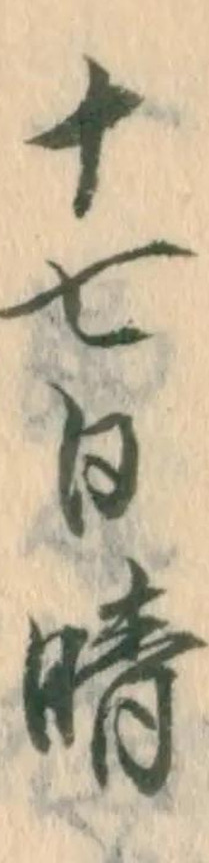十七日晴
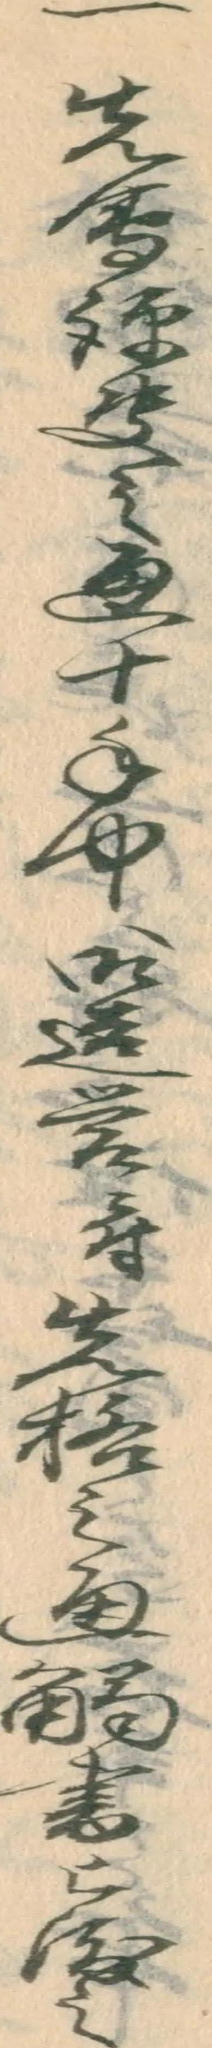一先会評決之通十手中へ御造営ニ付先格之通触書被渡之
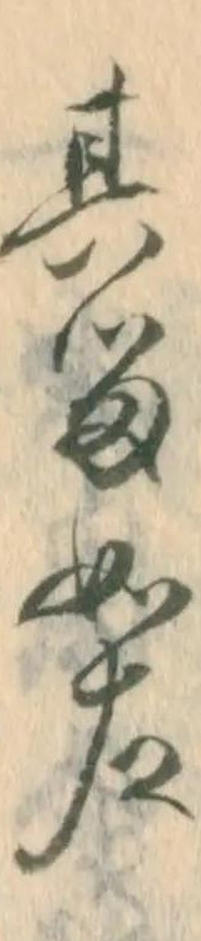其留如左

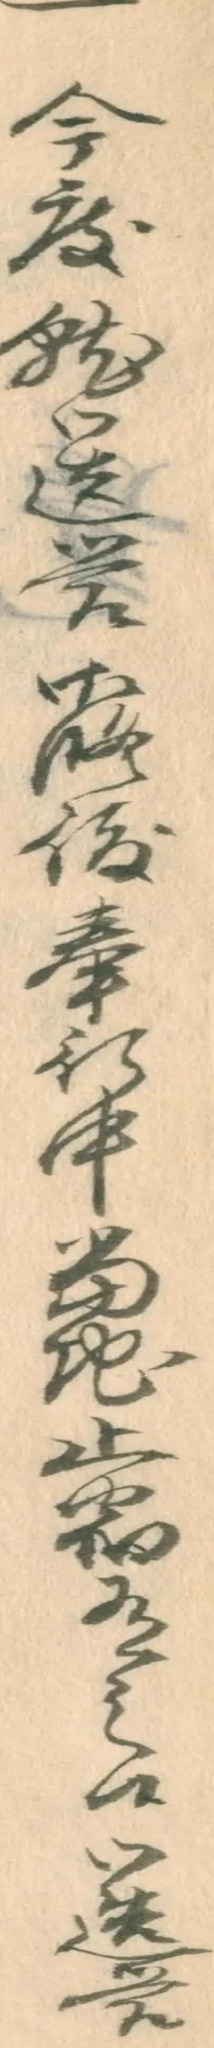一今度就御造営御修復奉行中当地止宿有之候御造営
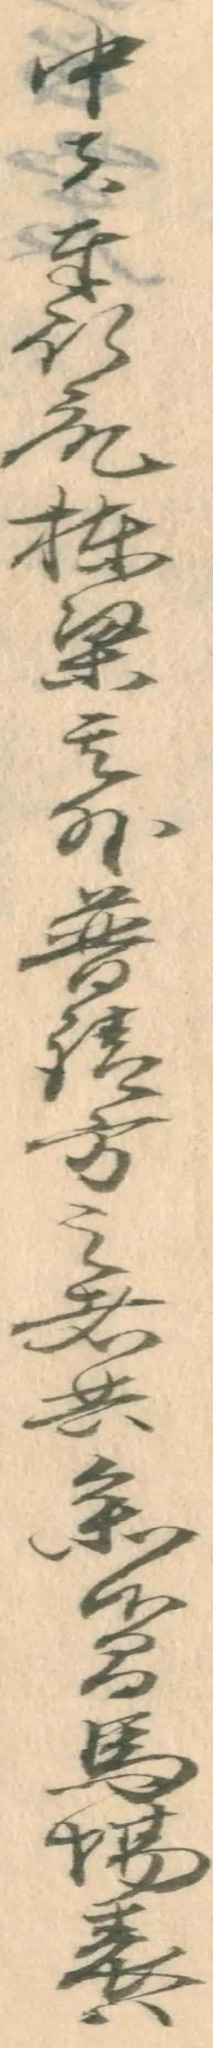中は奉行衆棟梁其外普請方之者共参候間馬場表ハ
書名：賀茂社記録. 第17冊
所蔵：国立国会図書館 National Diet Library, JAPAN
